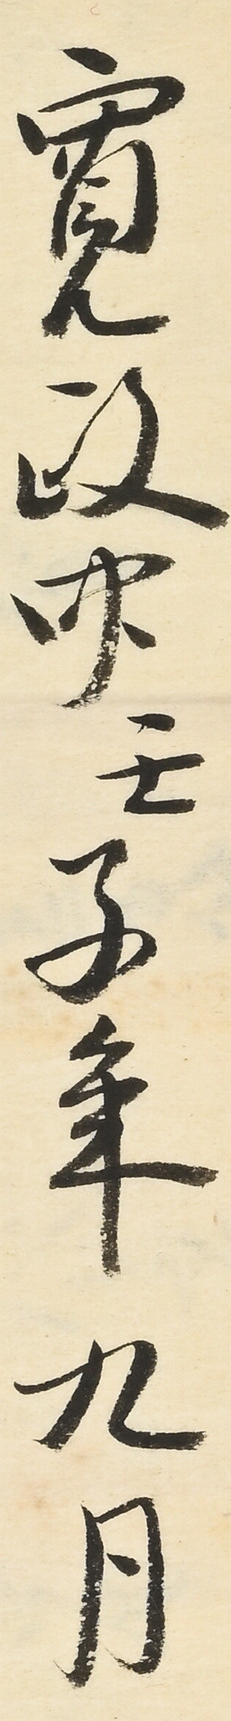寛政四壬子年九月
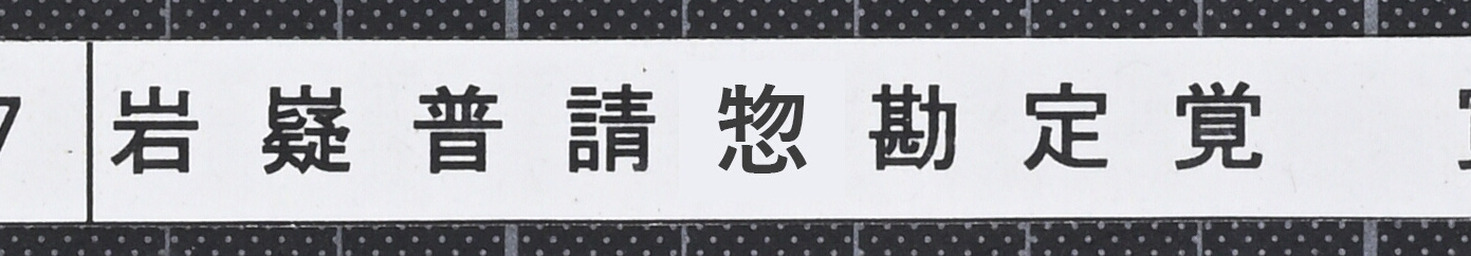岩嶷普請惣勘定覚
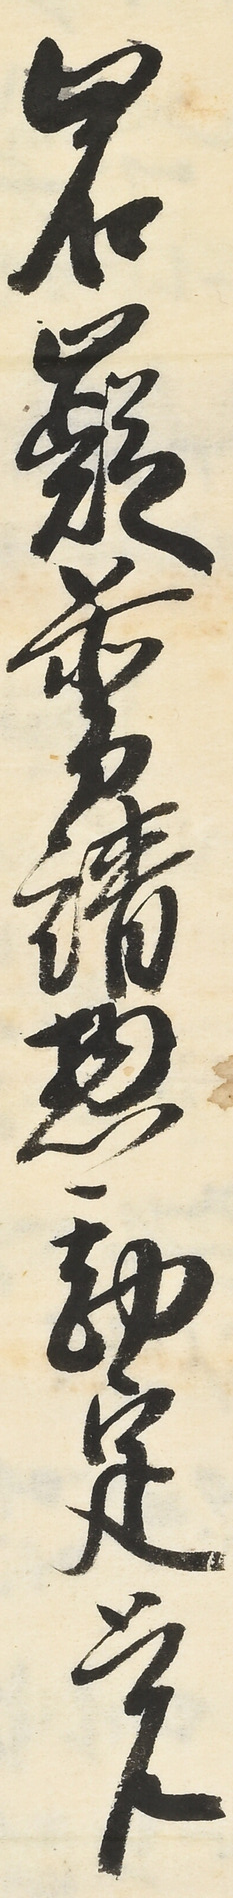岩嶷普請惣勘定覚

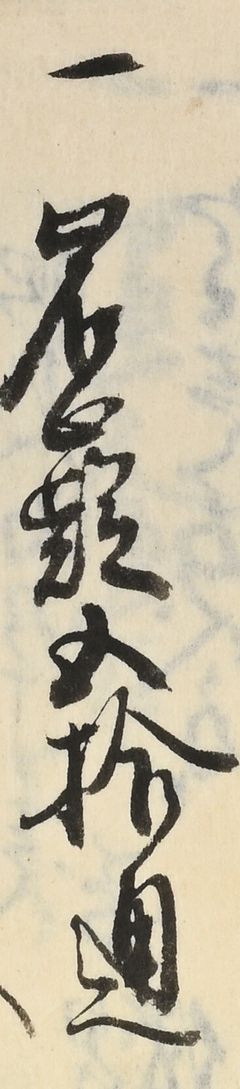一岩嶷五拾通
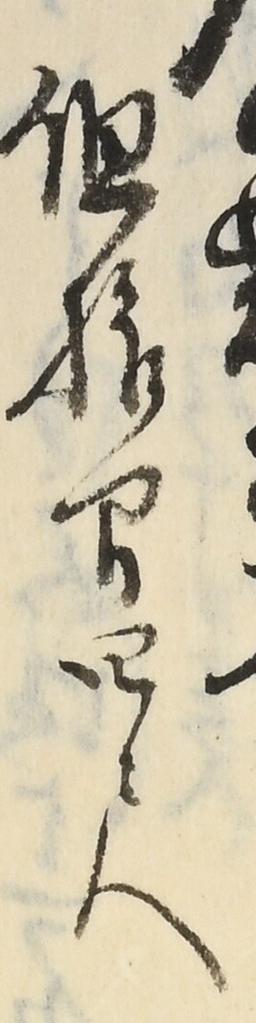但拾間四尺
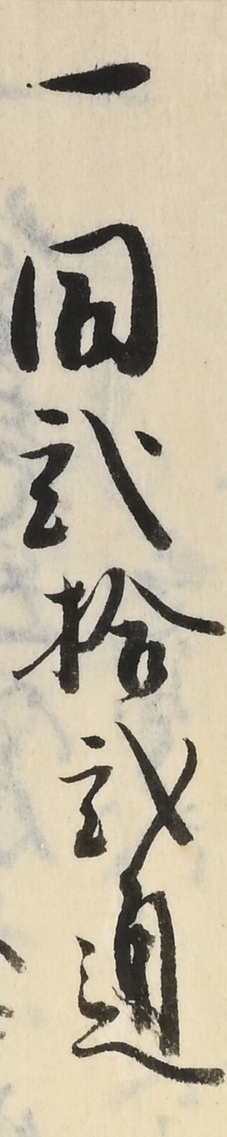一同弐拾弐通
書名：岩嶷普請惣勘定覚
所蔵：伊那市立高遠町図書館・合同会社AMANE
